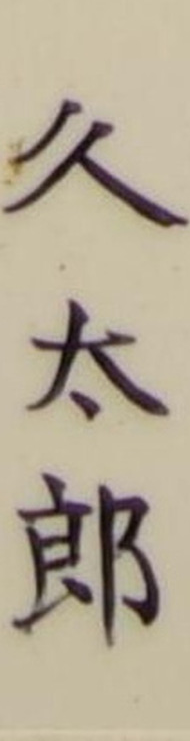久太郎
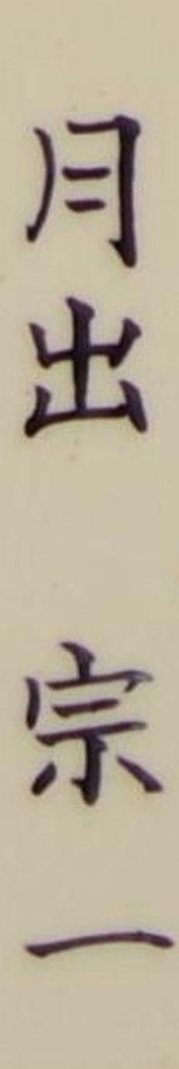月出宗一
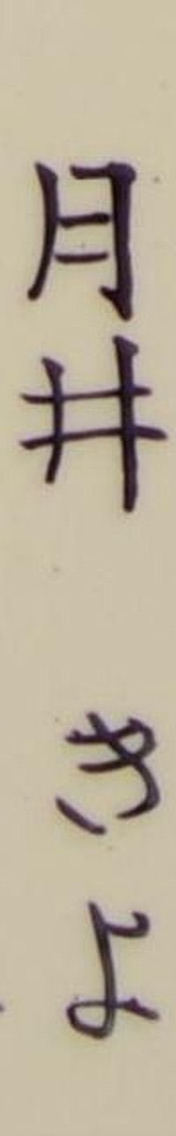月井きよ
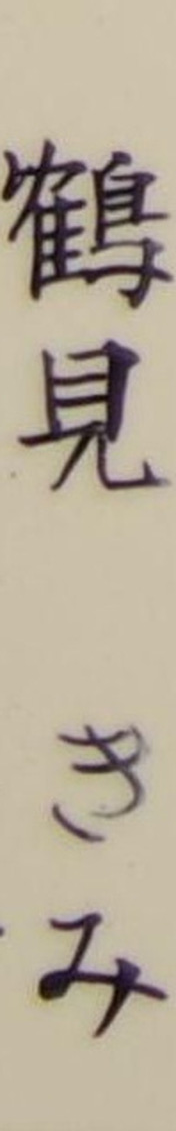鶴見きみ

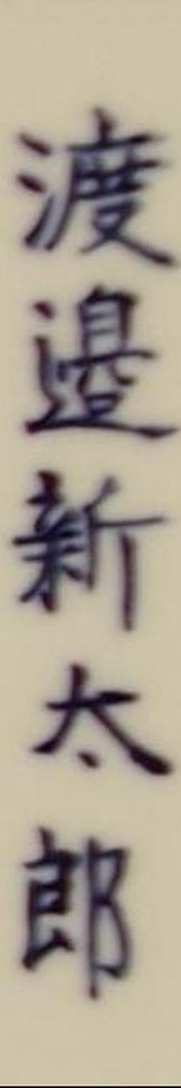渡邉新太郎
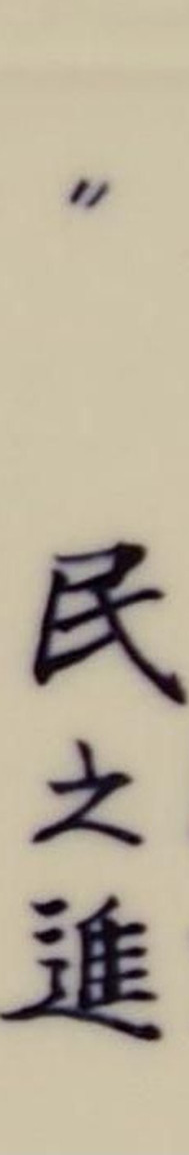民之進
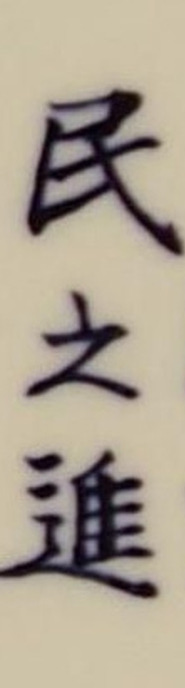民之進
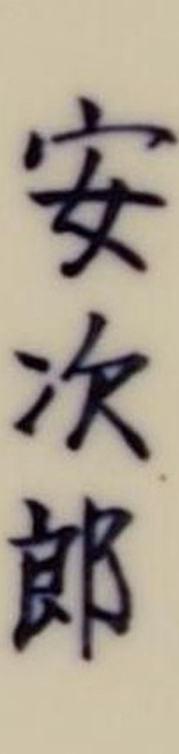安次郎
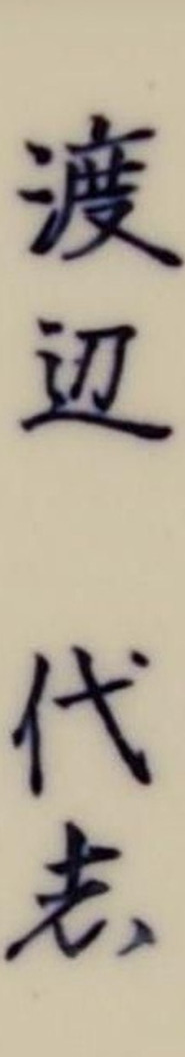渡辺代志
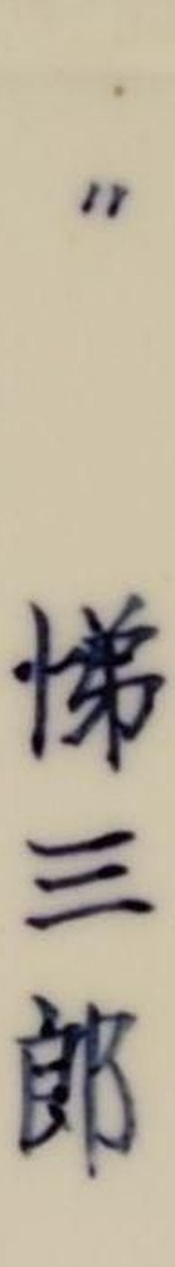悌三郎
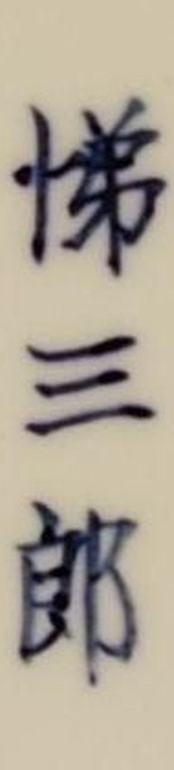悌三郎
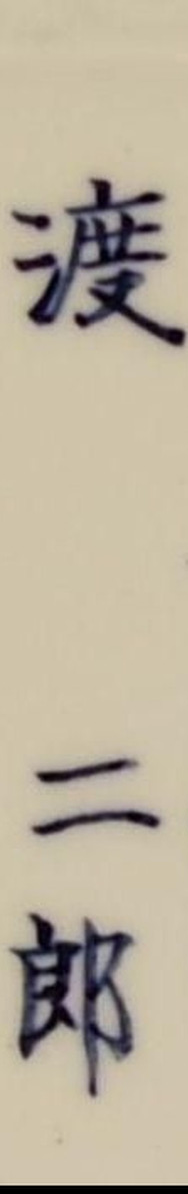渡二郎
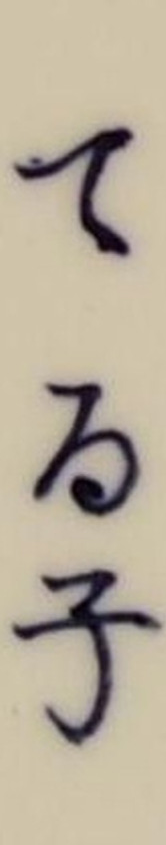てる子
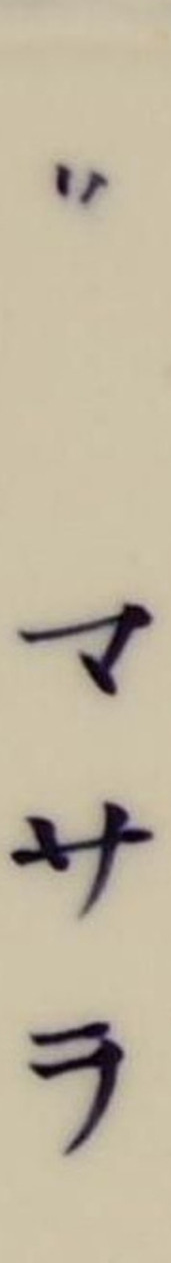マサヲ
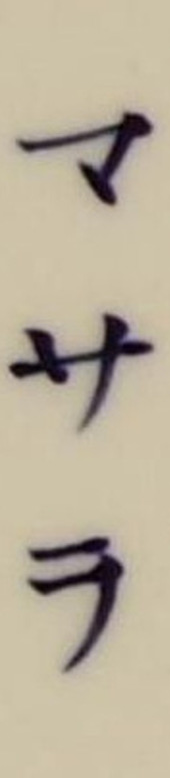マサヲ
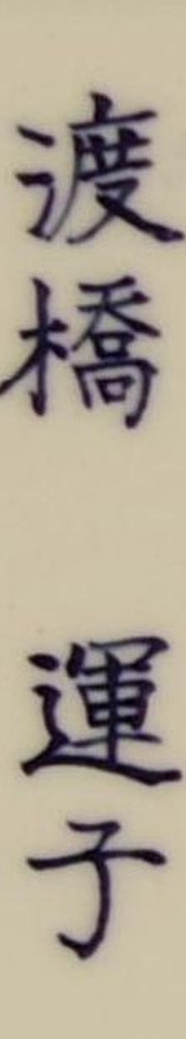渡橋運子
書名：E~L
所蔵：高野山金剛峯寺
